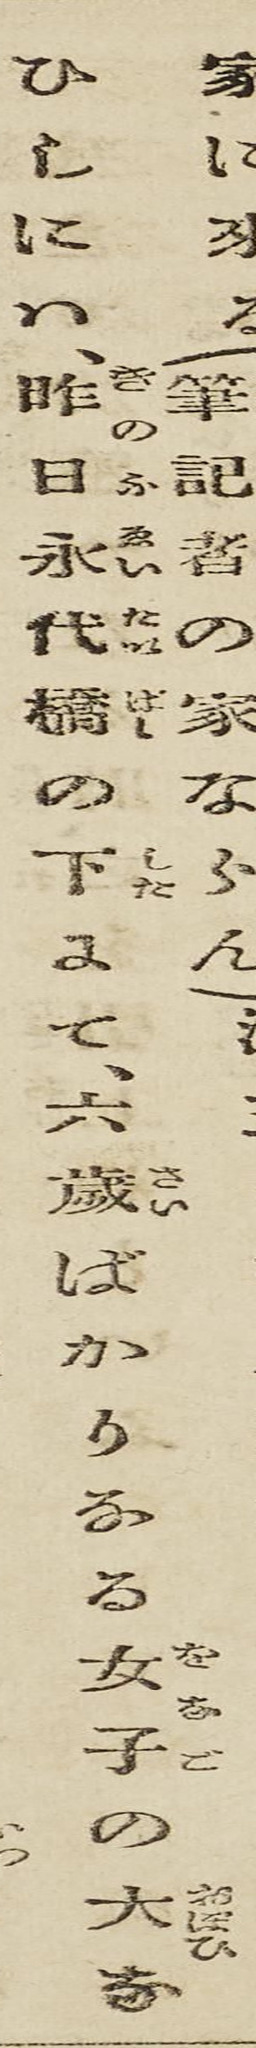ひしには、昨日永代橋の下にて、六歳ばかりなる女子の大な
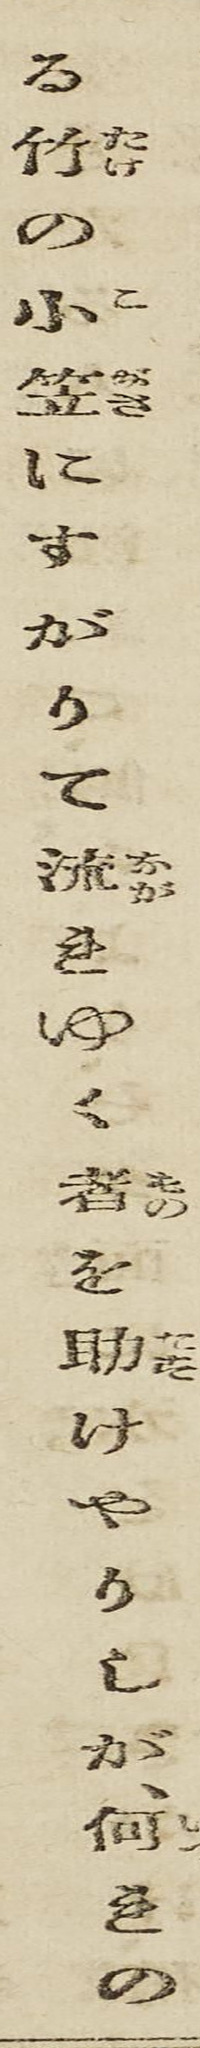る竹の小笠にすがりて流れゆく者を助けやりしが、何れの
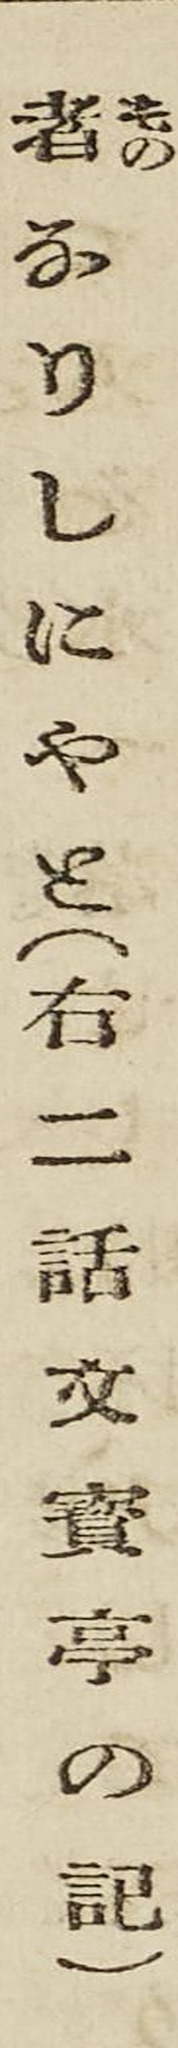者なりしにやと（右二話文實亭の記
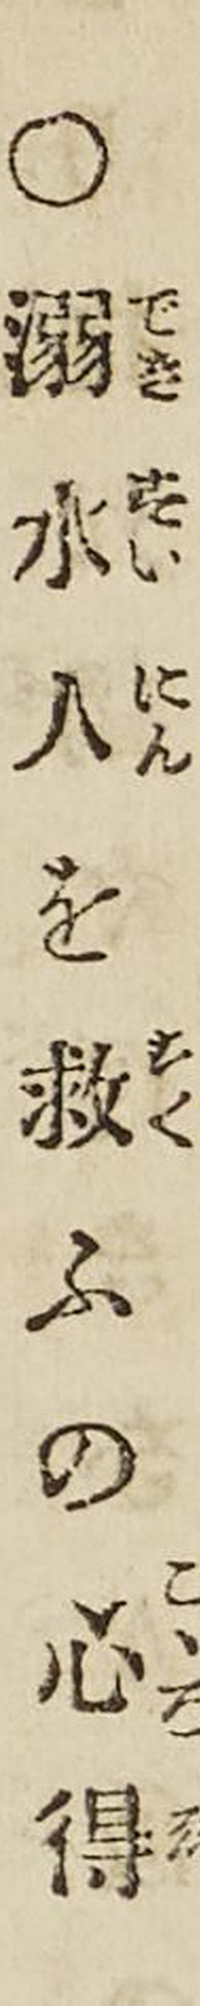○溺水人を救ふの心得
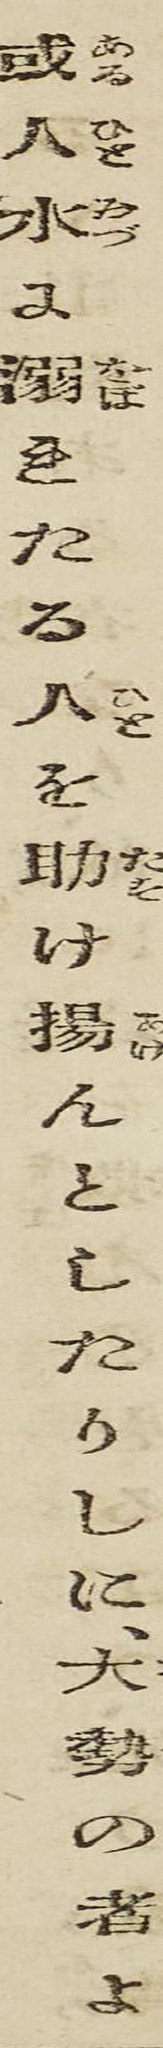或人水に溺れたる人を助け揚んとしたりしに、大勢の者よ
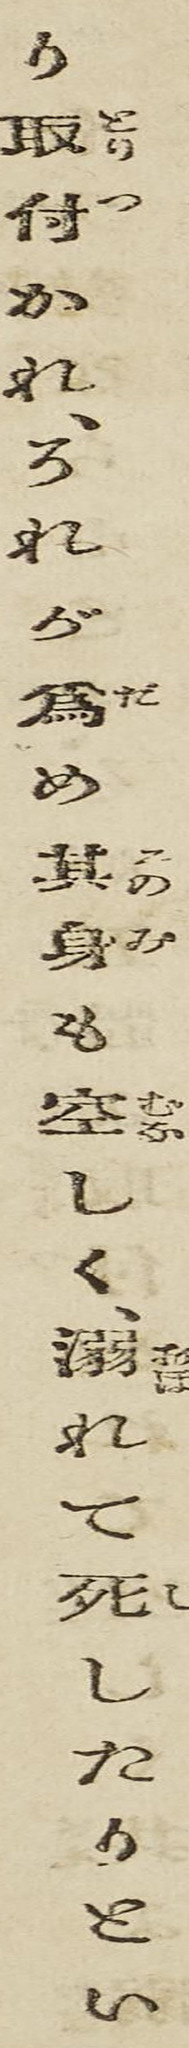り取付かれ、それが為め其身も空しく溺れて死したりとい

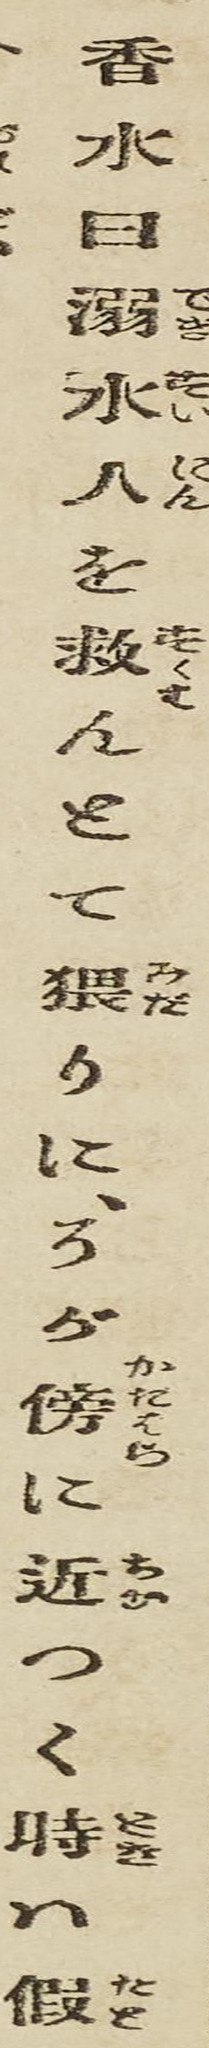香水曰溺水人を救んとて猥りに、そが傍に近つく時は仮
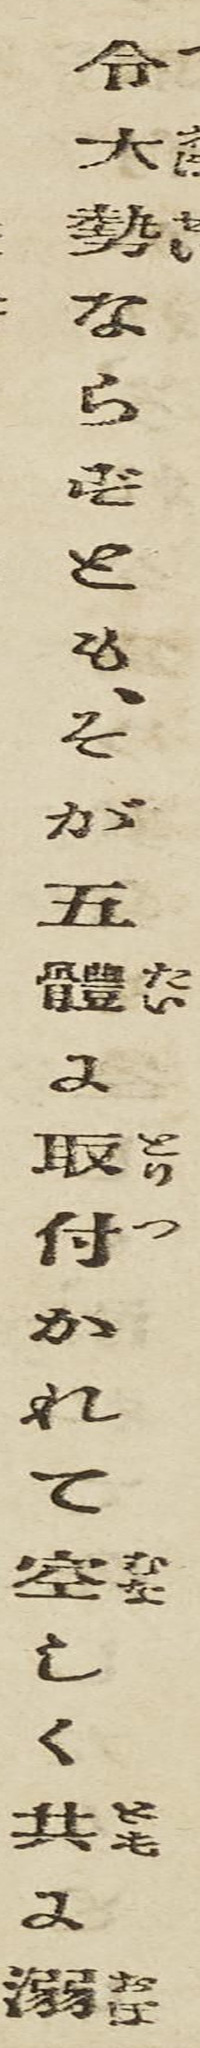令大勢ならずとも、そが五体に取付かれて空しく共に溺
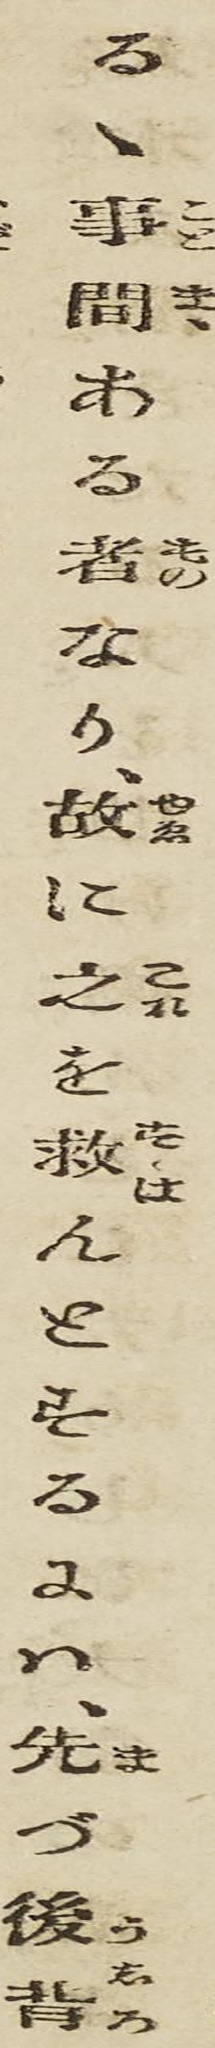るゝ事間ある者なり、故に之を救んとするには、先づ後背
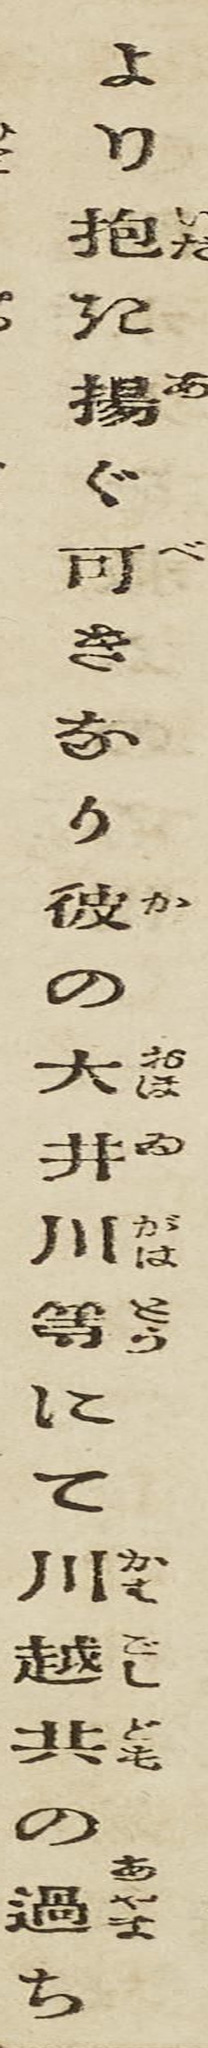より抱き揚ぐ可きなり彼の大井川等にて川越共の過ち
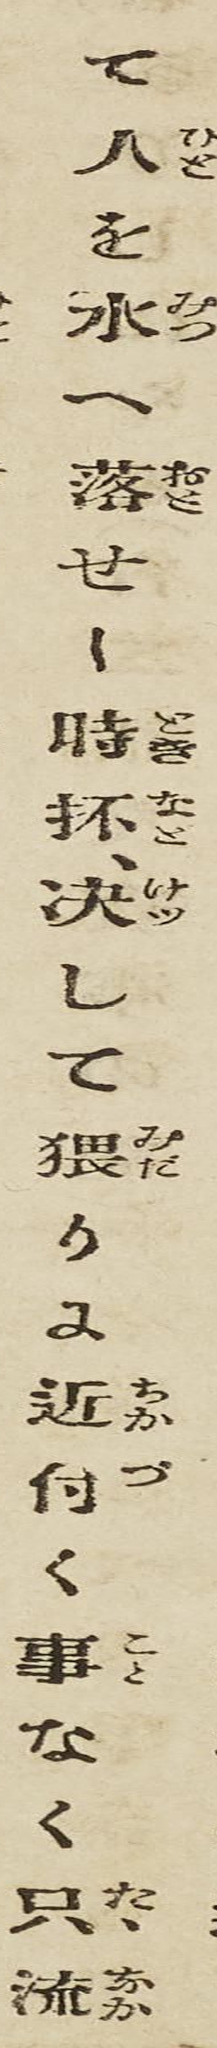て人を水へ落せし時抔、決して猥りに近付く事なく只流
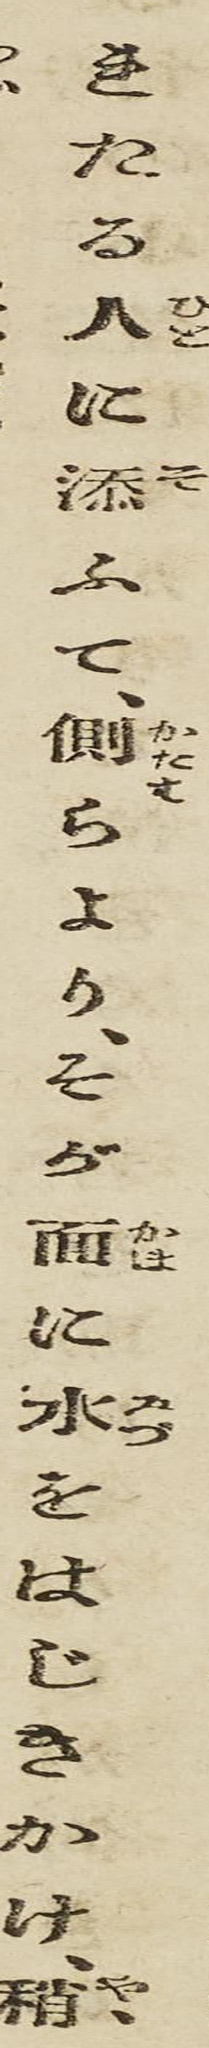れたる人に添ふて、側らより、そが面に水をはじきかけ、稍
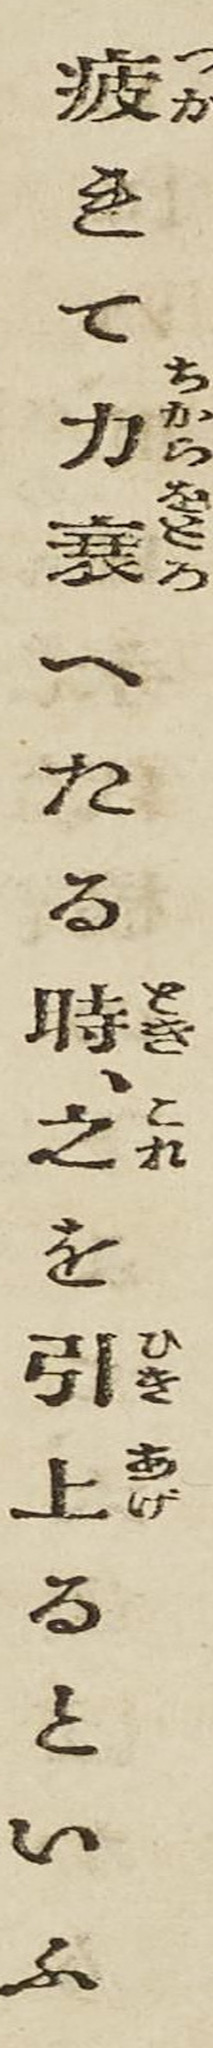疲れて力衰へたる時、之を引上るといふ
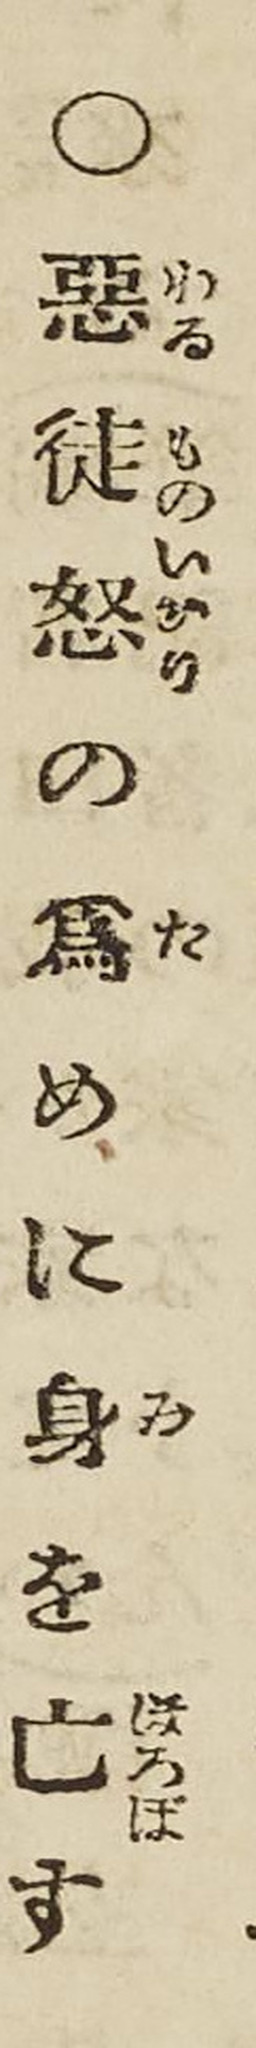○悪徒怒の為めに身を亡す
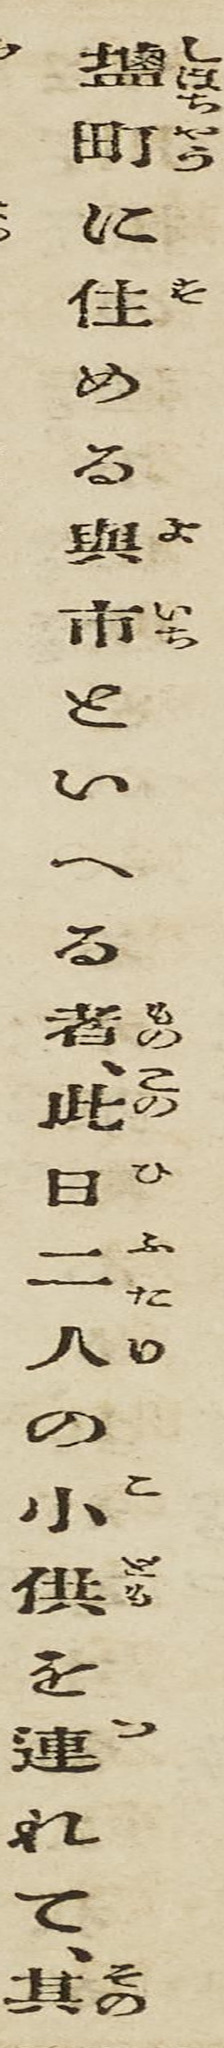塩町に住める與一といへる者、此日二人の子供を連れて、其
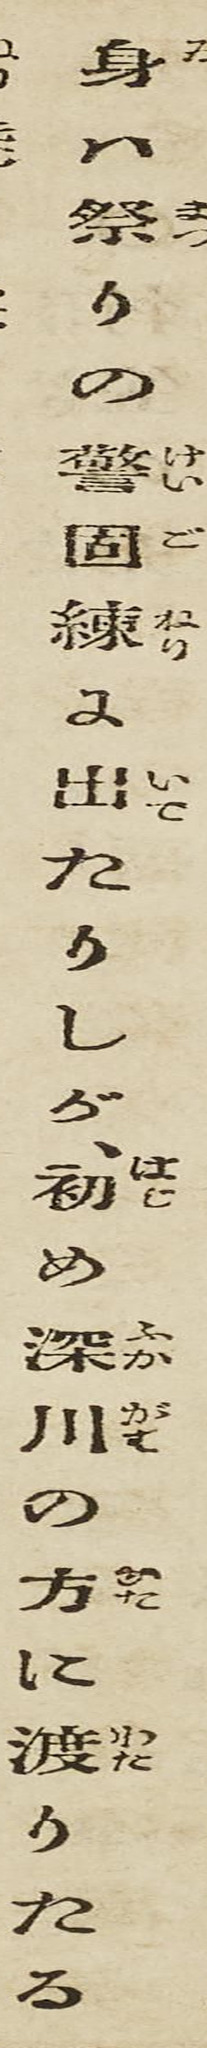身は祭りの警護練に出たりしが、初め深川の方に渡りたる
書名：永代惨話　文化の夢　全
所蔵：東京大学地震研究所図書室 Earthquake Research Institute Library, The University of Tokyo, JAPAN
